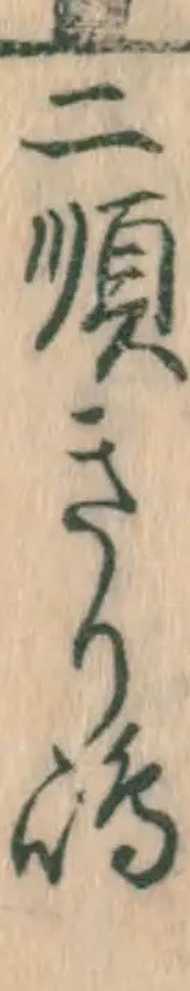二順きり嶋
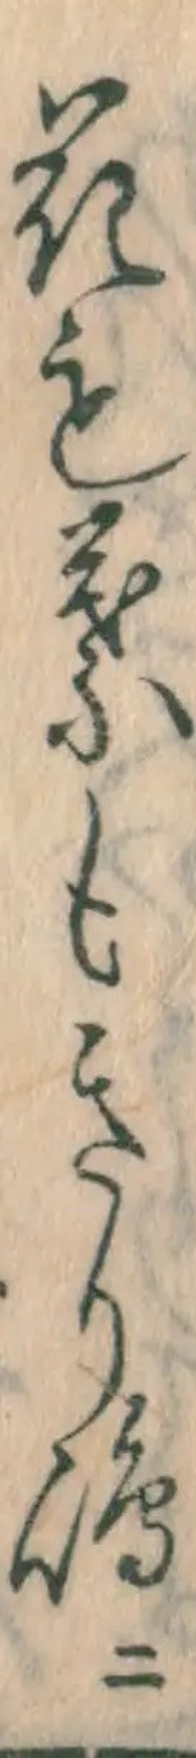花も葉もきり嶋
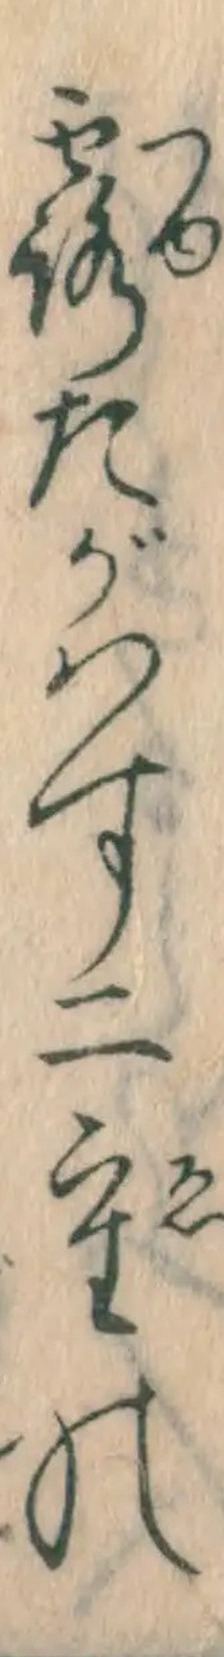露たがはすに重の
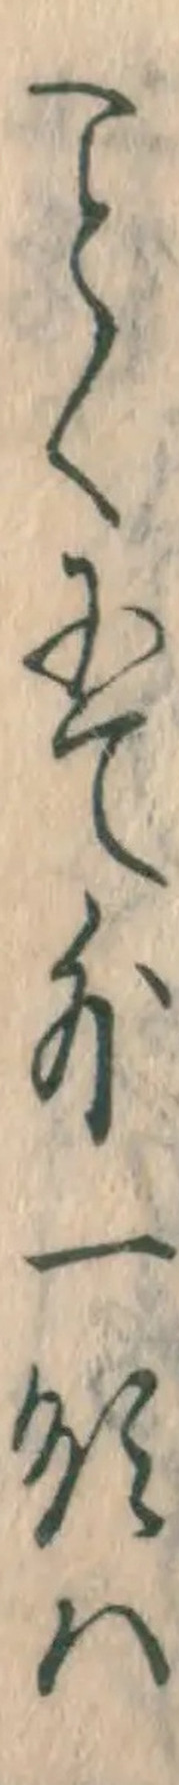ことくにて外一順は
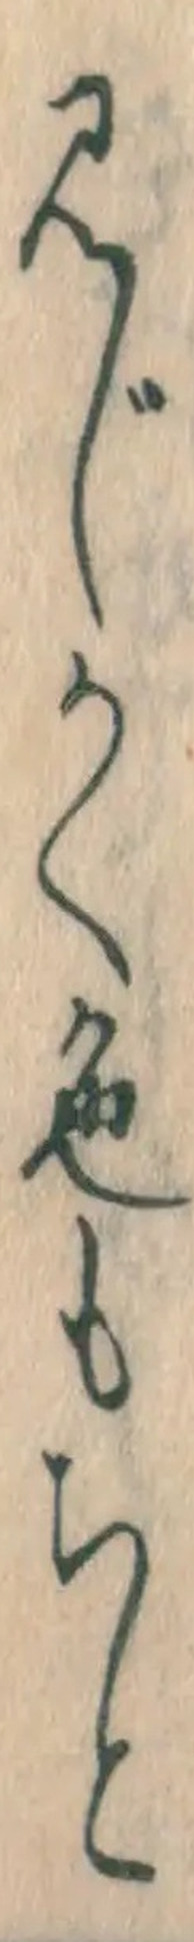みじかく色もちと
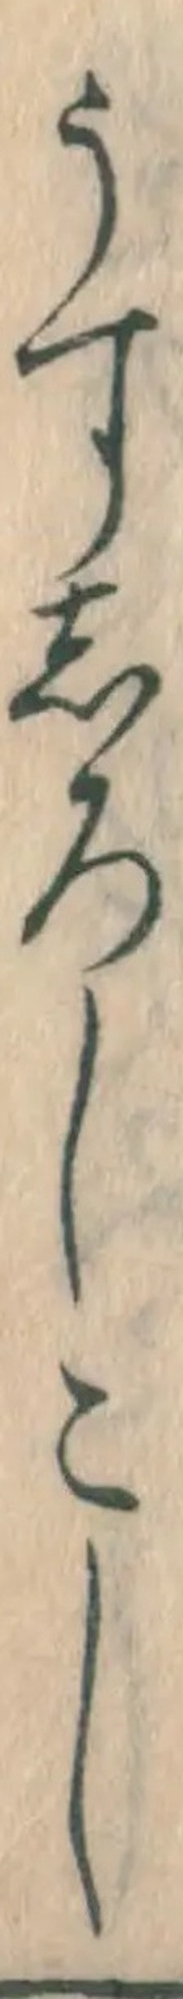うすしろしこし

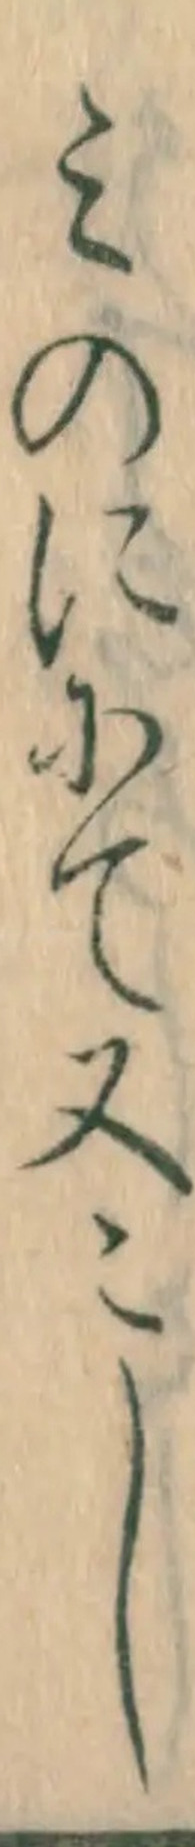みのににて又こし
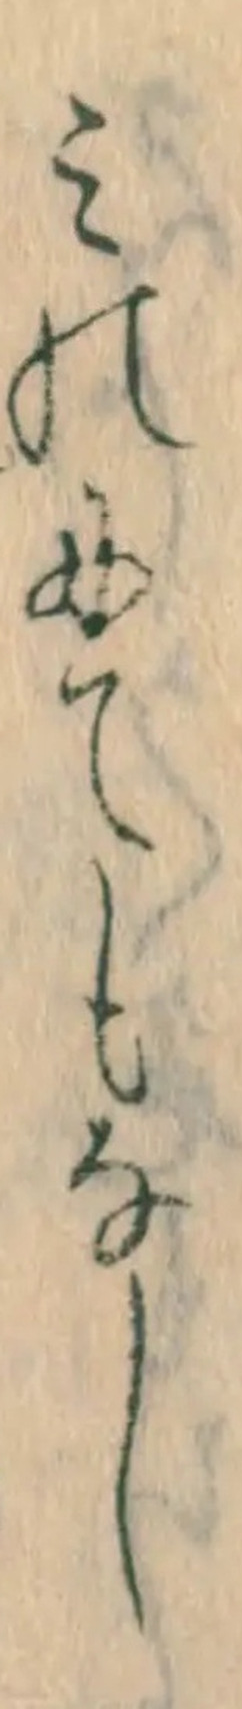みのにてもなし
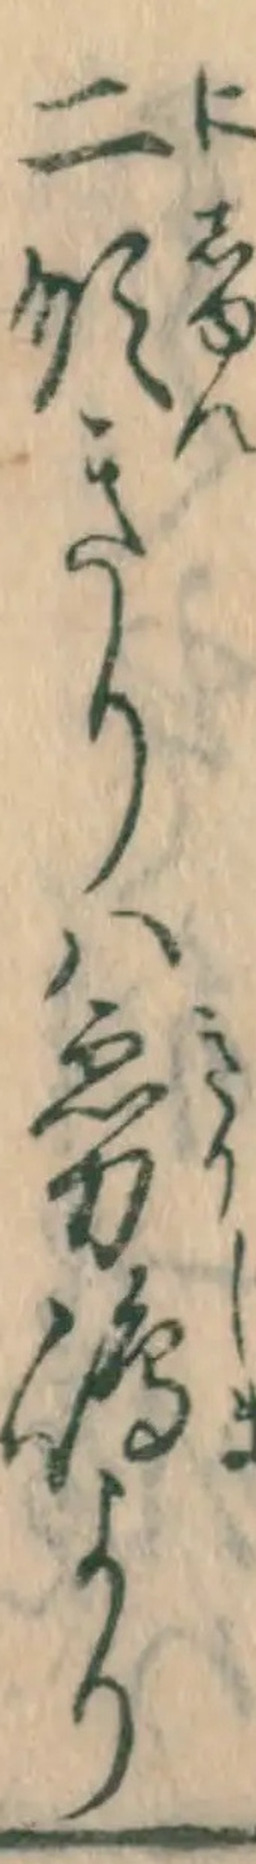二順きりは霧嶋より
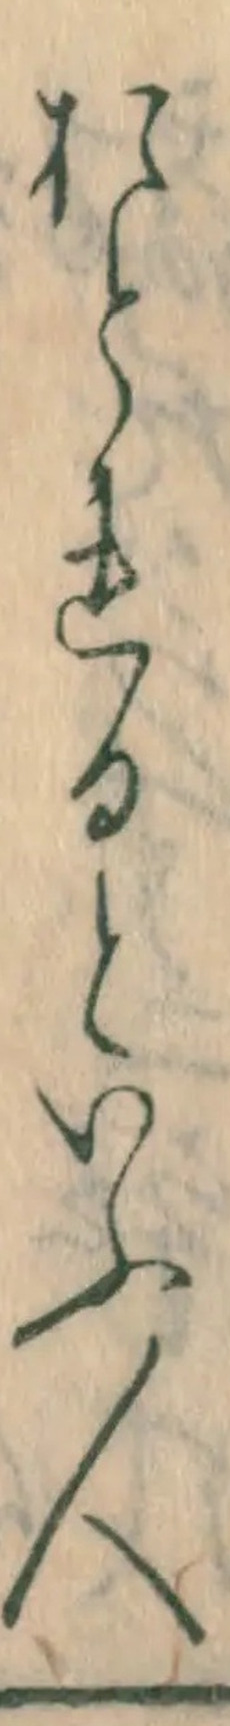おとれるといふ人
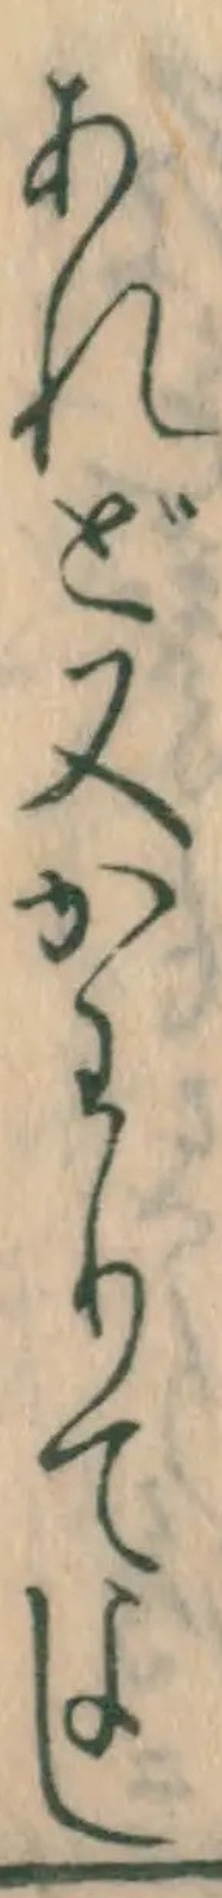あれど又かわりてよし
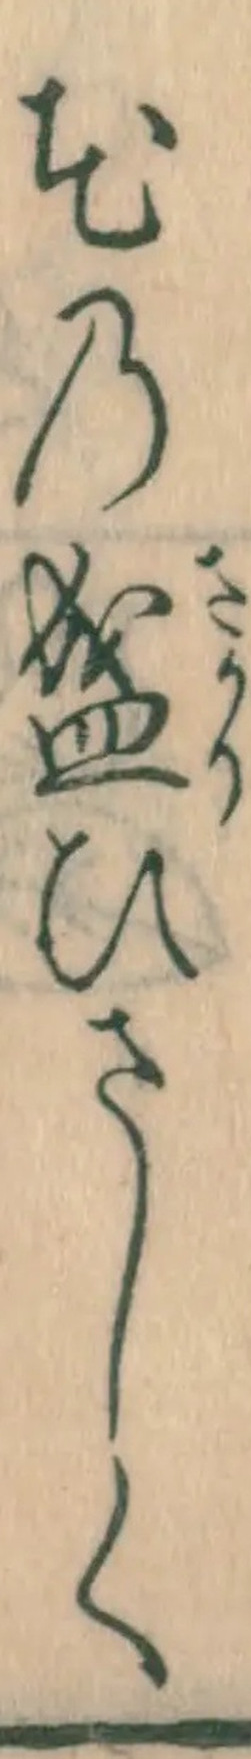花の盛ひさしく
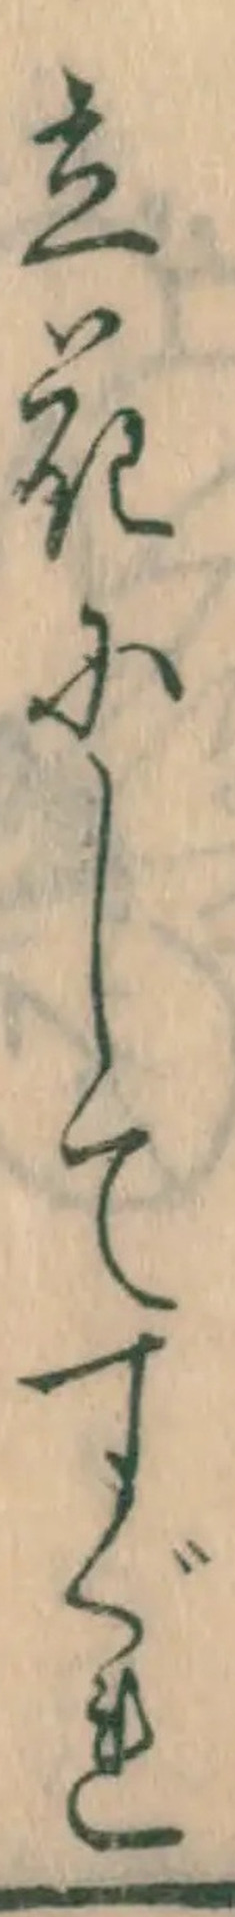立花にしてすぐれ
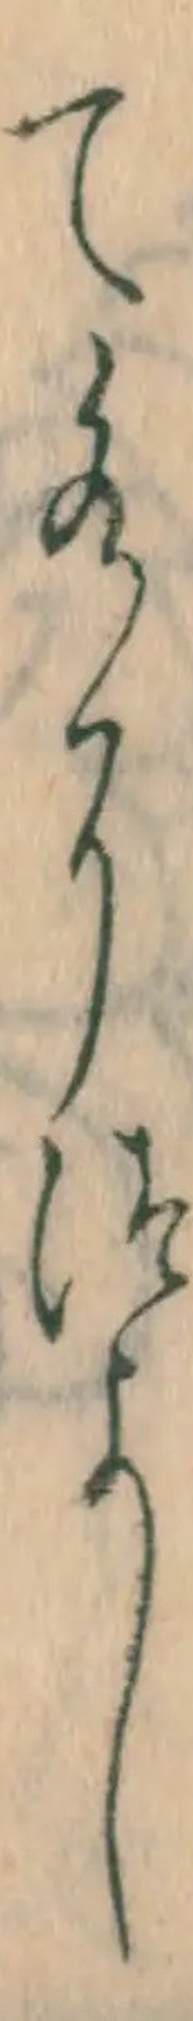て水につよし
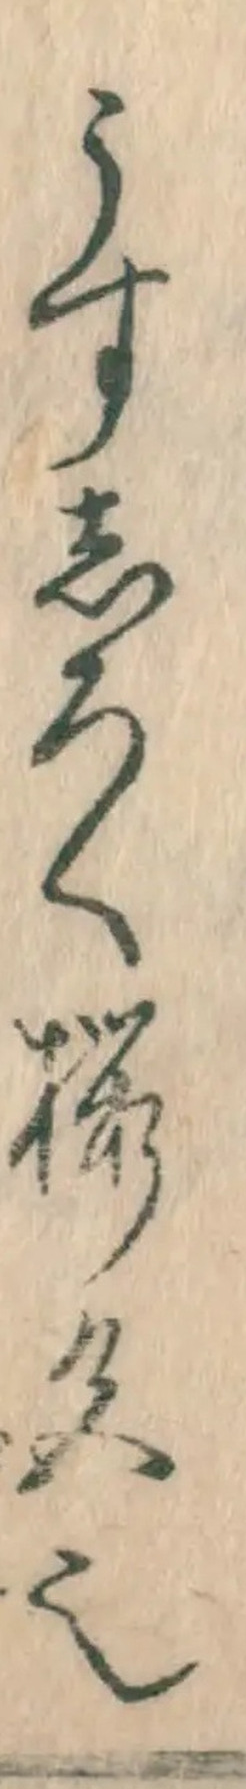うすしろく桜色也
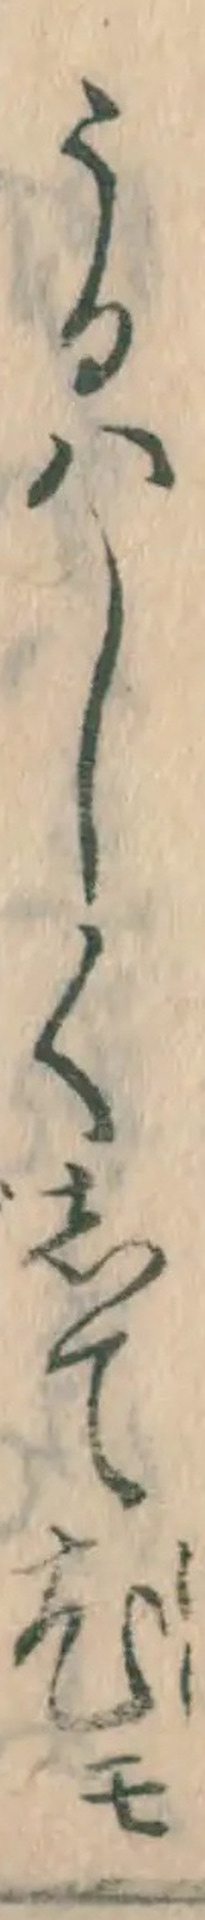うるはしくして尤も
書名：錦繍枕 5巻. [1]
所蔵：国立国会図書館 National Diet Library, JAPAN
